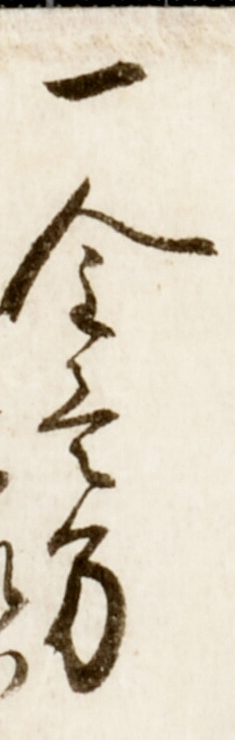一金壱分
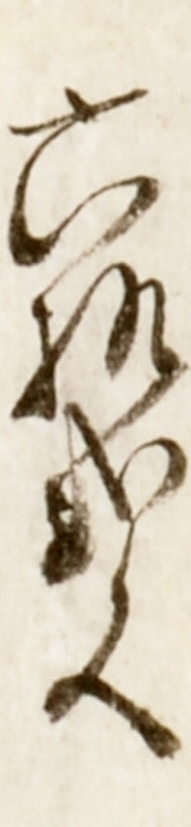六拾弐文
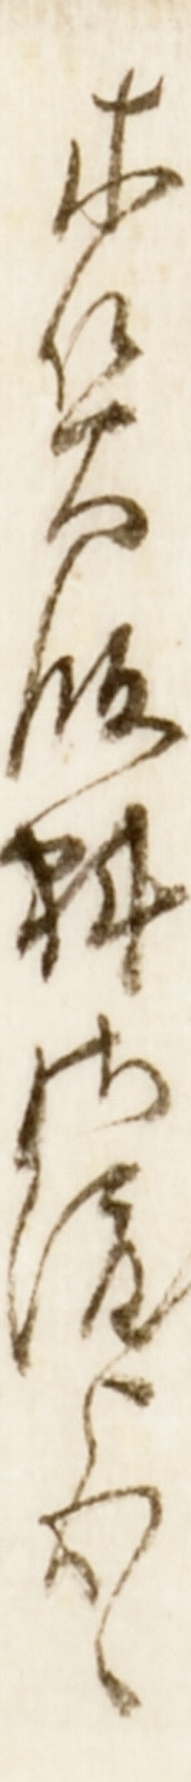木賃飯料御渡被成候
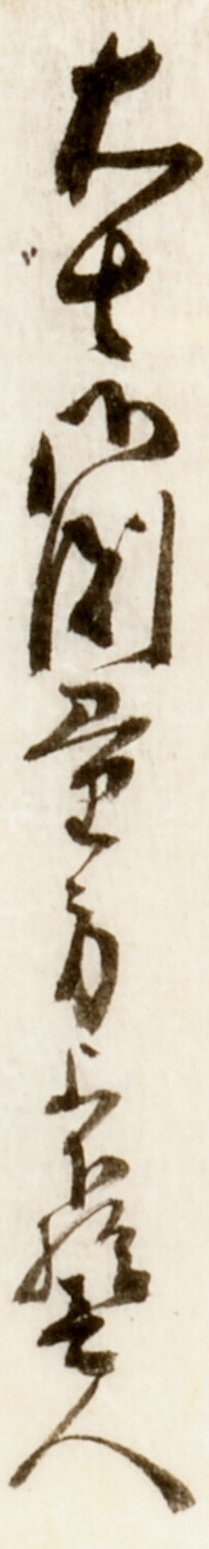右者御測量方上下拾壱人
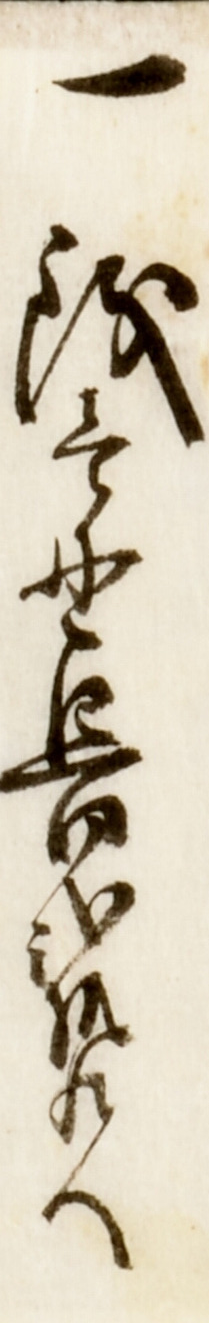一銭壱貫四百弐拾九文
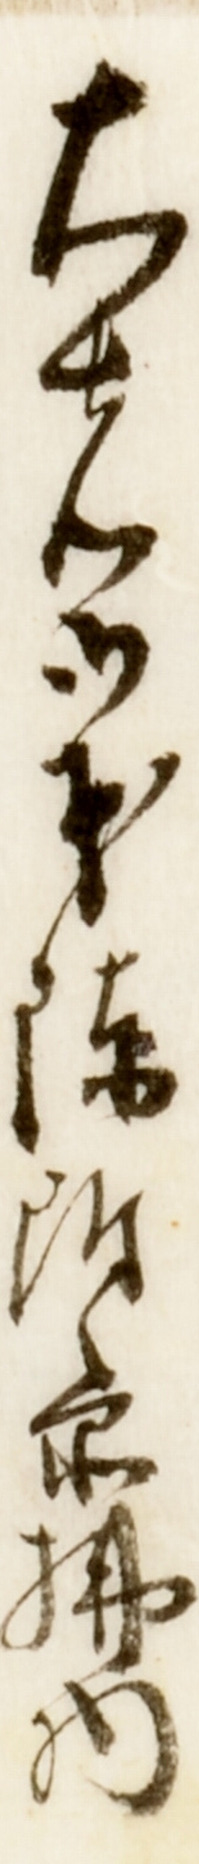右者御本陣附候品払内
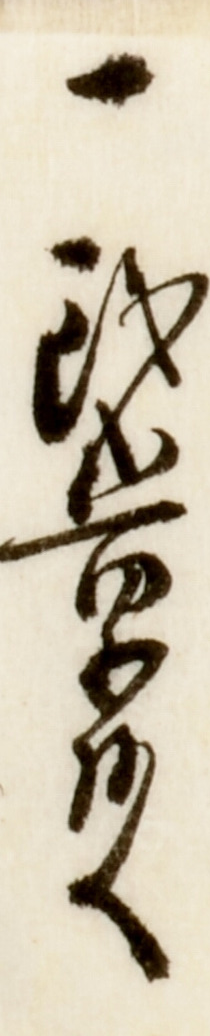一銭弐百五拾文
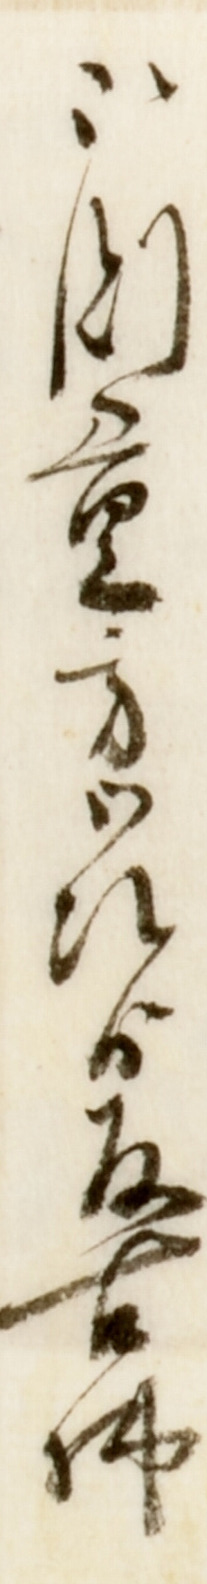御測量方御頭ゟ反故払

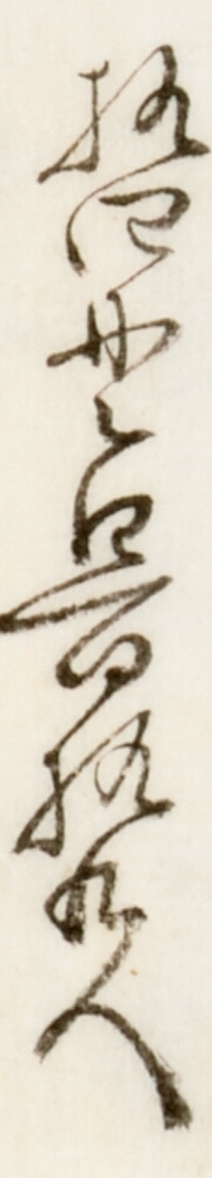拾四貫四百拾九文
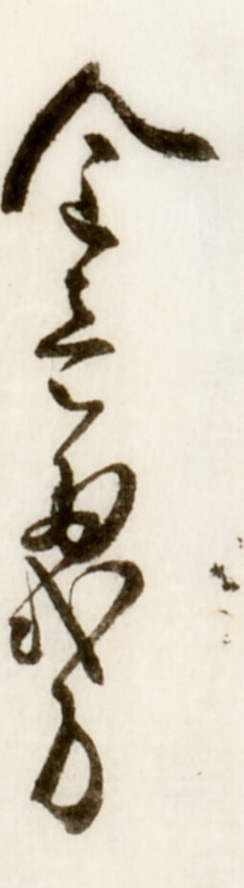金壱両弐分
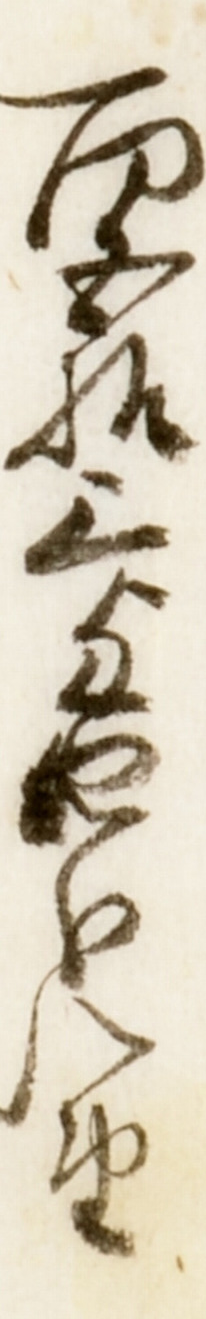百五拾三匁四分八厘
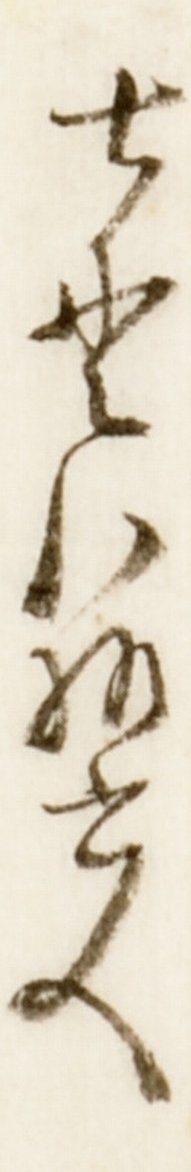七貫八拾六文
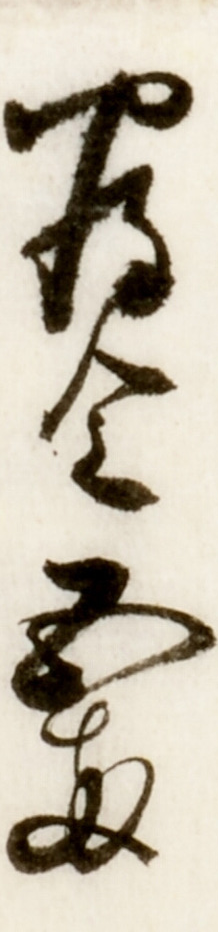為金五両
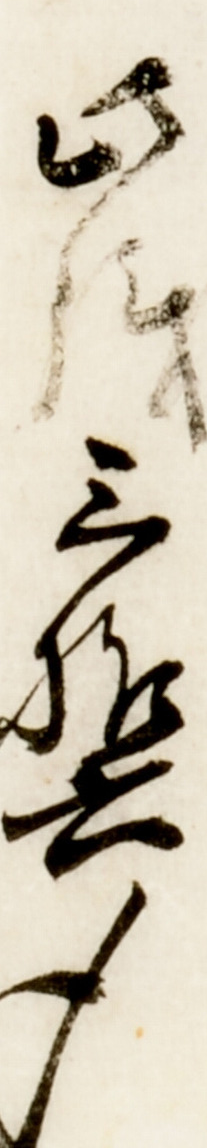此銭三拾六〆
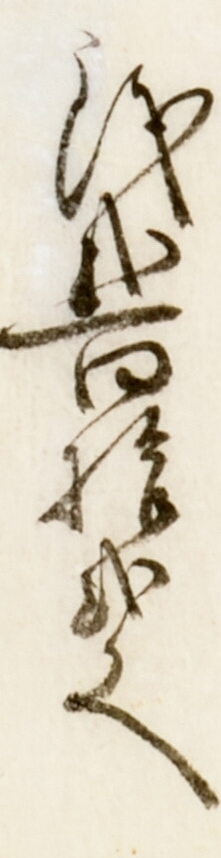銭弐百拾弐文
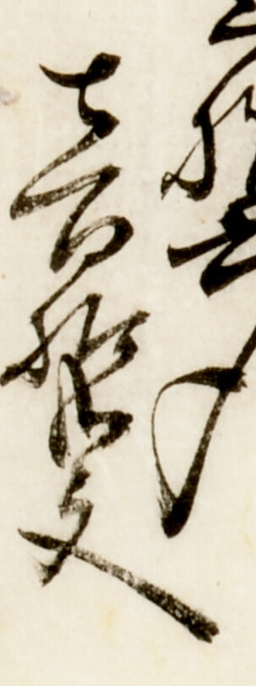七百拾弐文
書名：御泊御窺聞合わせ諸入用割合帳
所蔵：伊那市立高遠町図書館・合同会社AMANE
